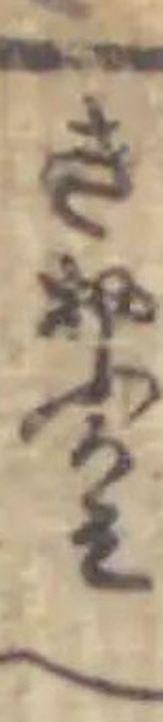きおふかみ
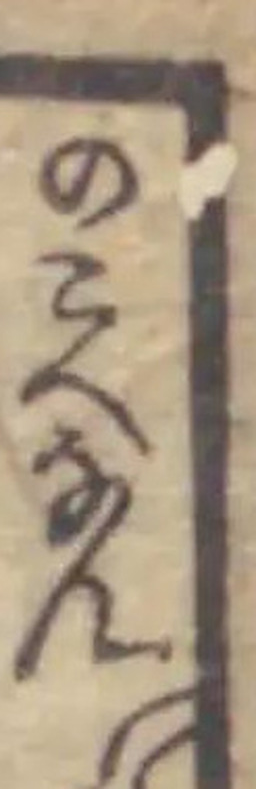のこへなん
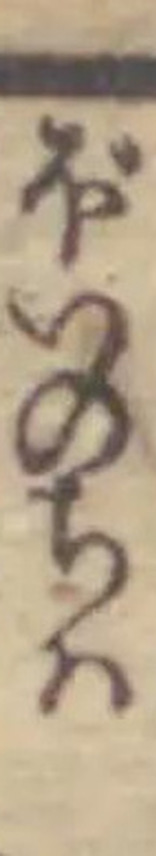ぼいのちは
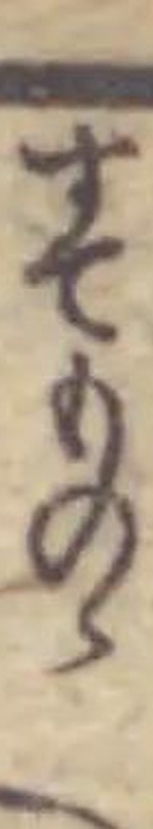すてものゝ
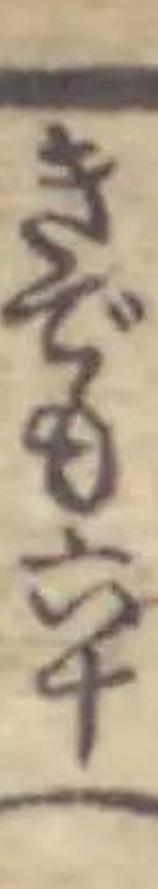きでも六十
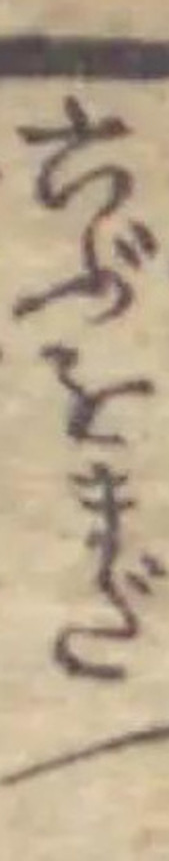六ぶをまだ
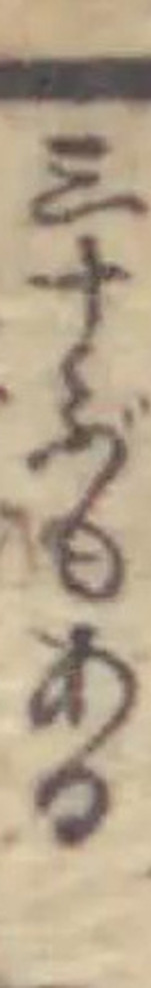三十ぶもある
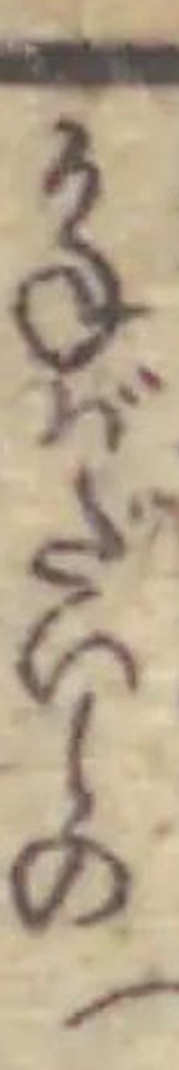かねばだいしの
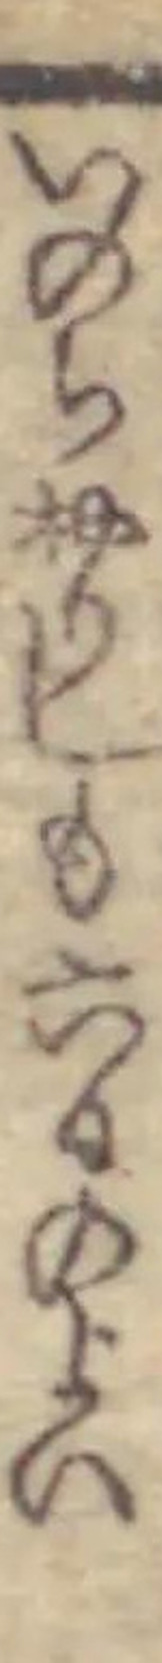いのちおりしも六日のよい
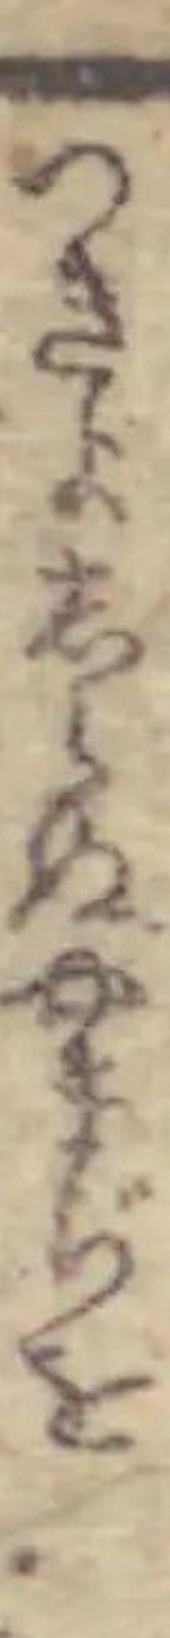つきよしらぬやまぢを
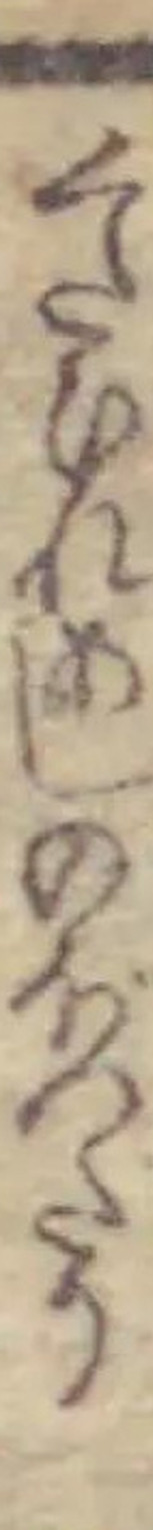くたびれあしのぼつたり
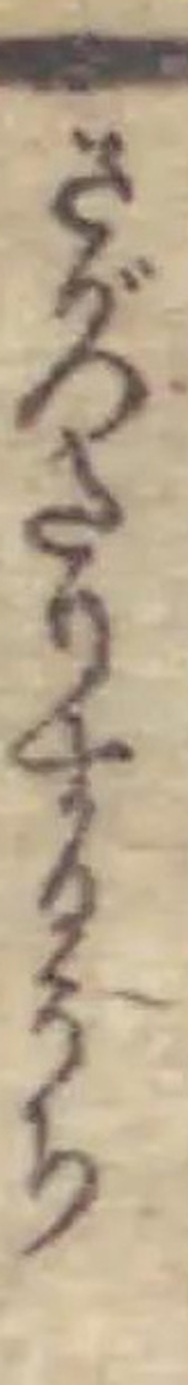さがつたりするうち
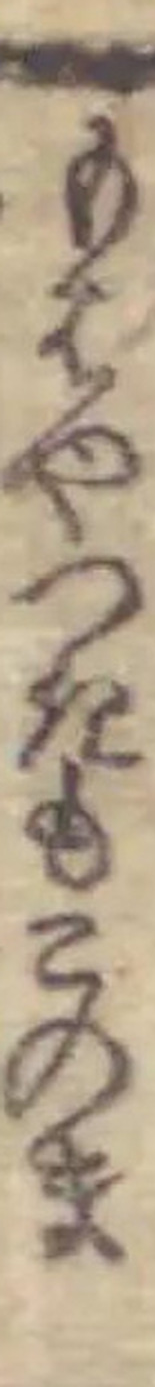もはやつきもこのま
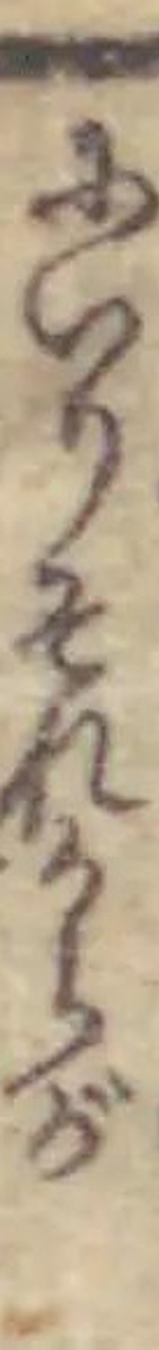にいりそれからが
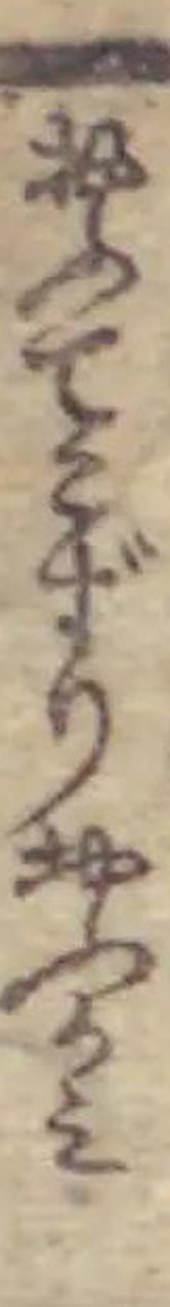おふてこずりおふかみ
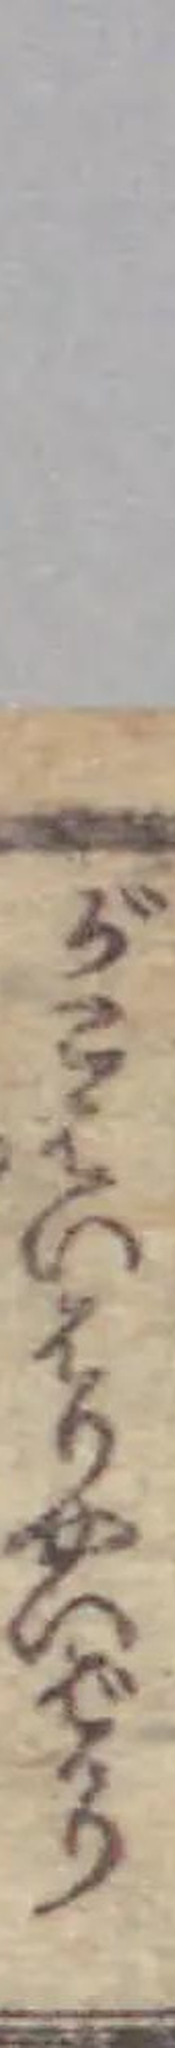がこはいはりやいばかり
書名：もふもふもふ怖噺 2巻
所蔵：国立国会図書館 National Diet Library, JAPAN
